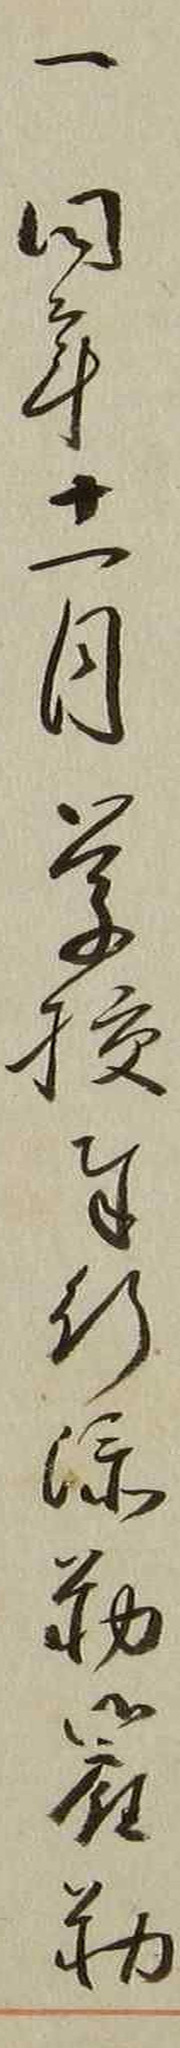一同年十一月学校奉行添勤御雇勤
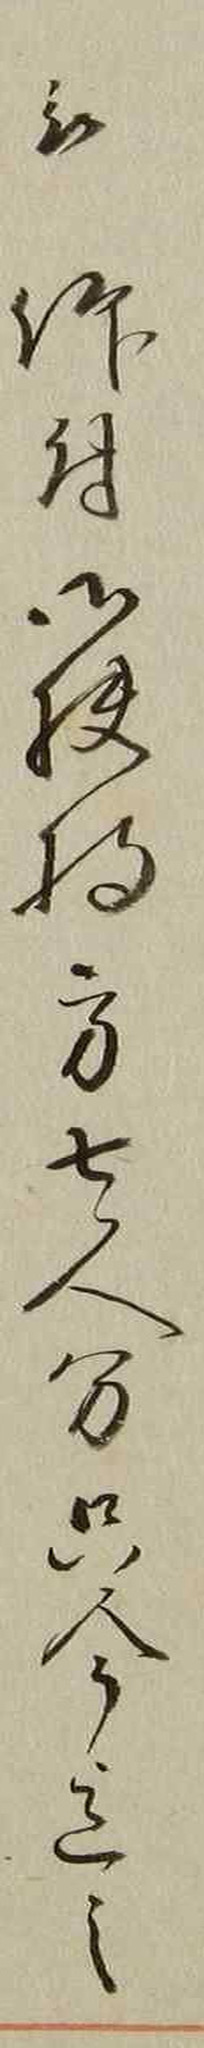被仰付御扶持方七人分只今迄之
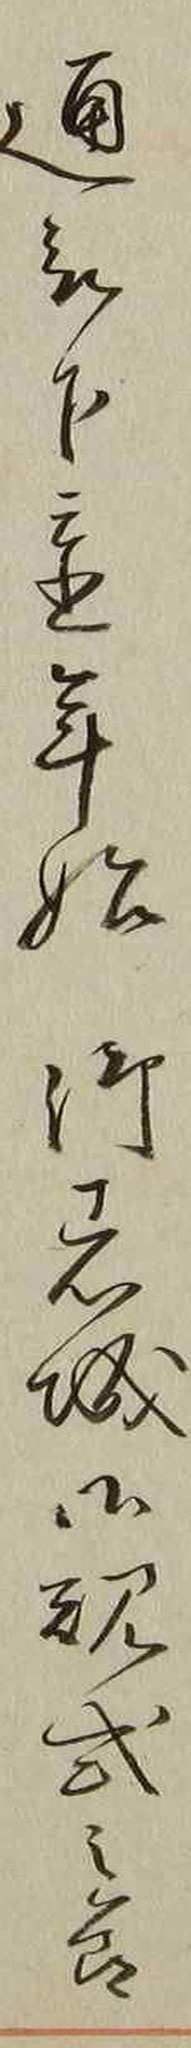通被下置年始御着城御規式之節
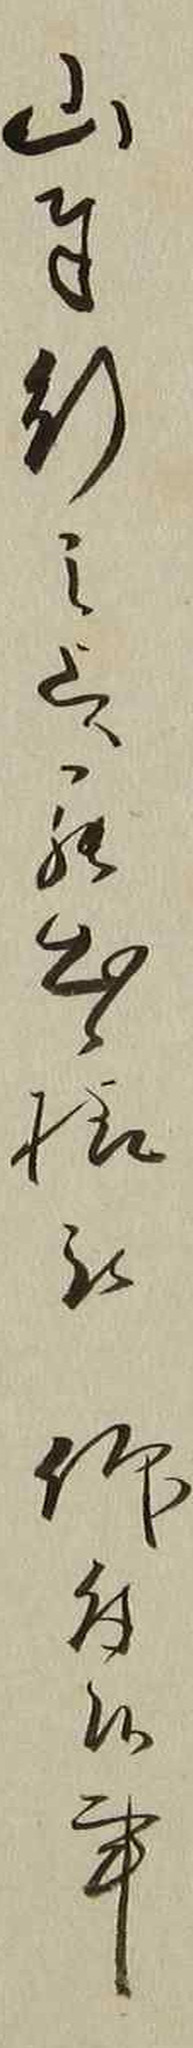山奉行之上へ罷出候様被仰付候事
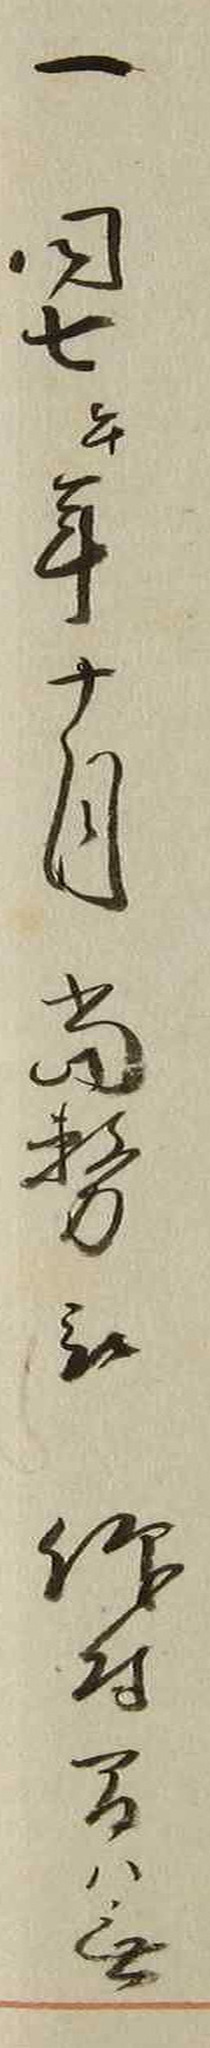一同七午年十月当務被仰付間ハ無
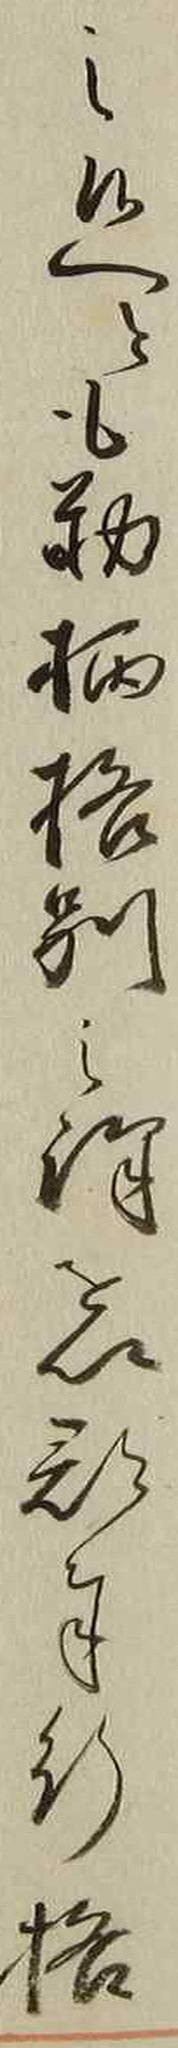之候へとも勤柄格別之訳を以郡奉行格
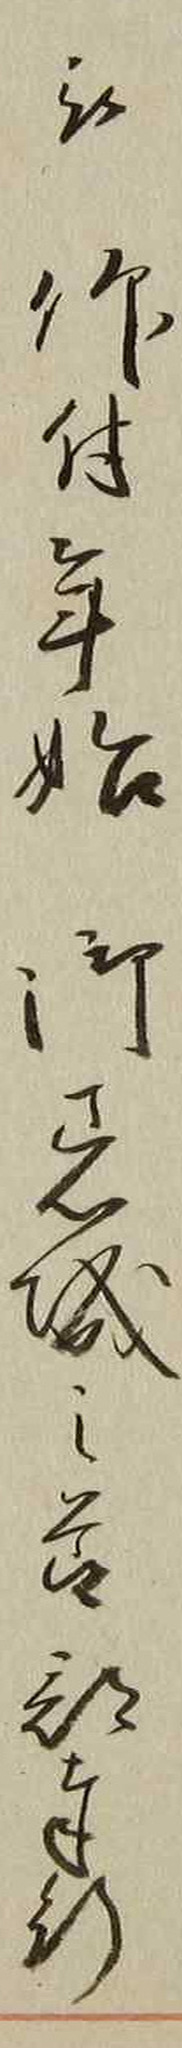被仰付年始御着城之節郡奉行
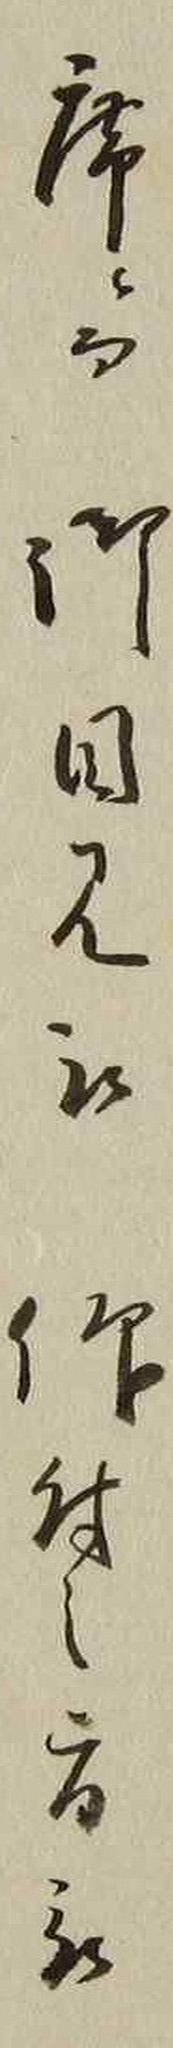席ニ而御目見被仰付之旨被
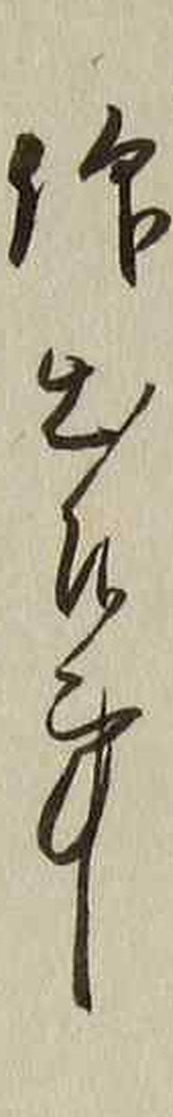仰出候事
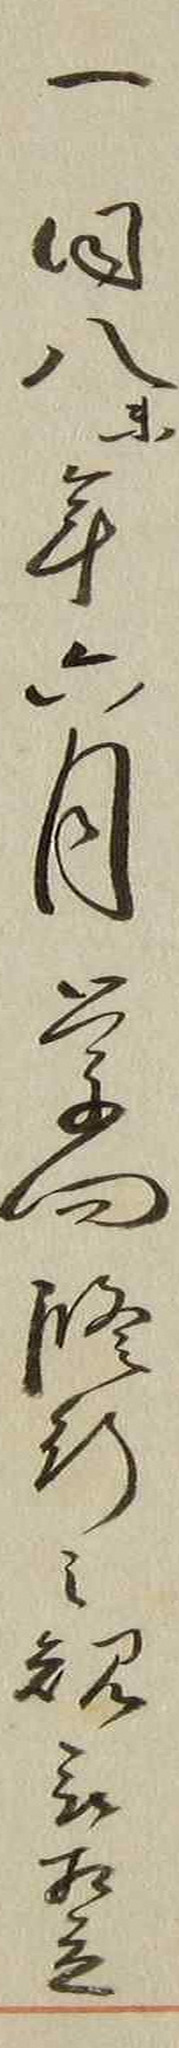一同八未年六月学問修行之規被相立
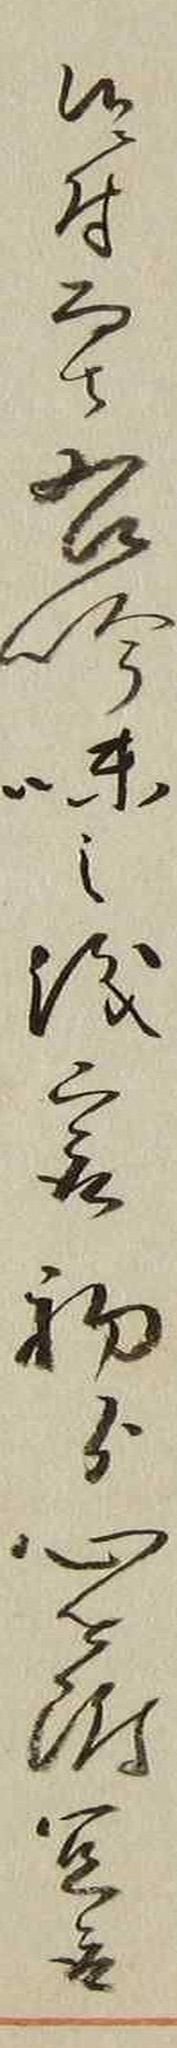候ニ付而者右吟味之儀最初ゟ心を附宜取
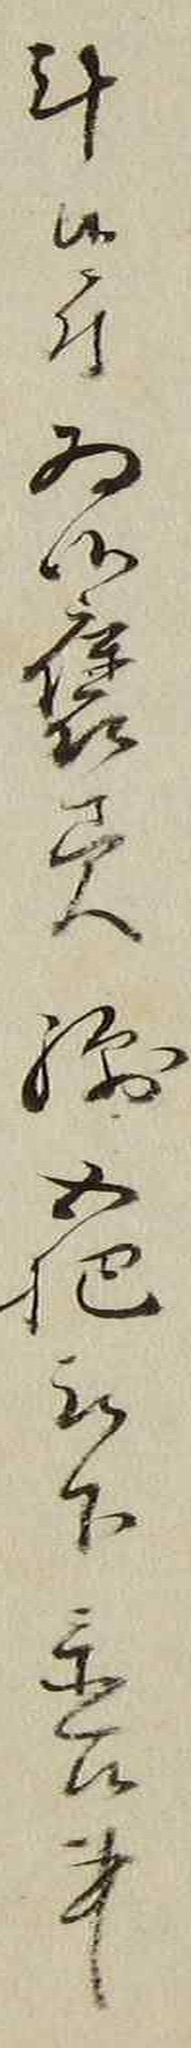斗候ニ付為御褒美綿五把被下置候事
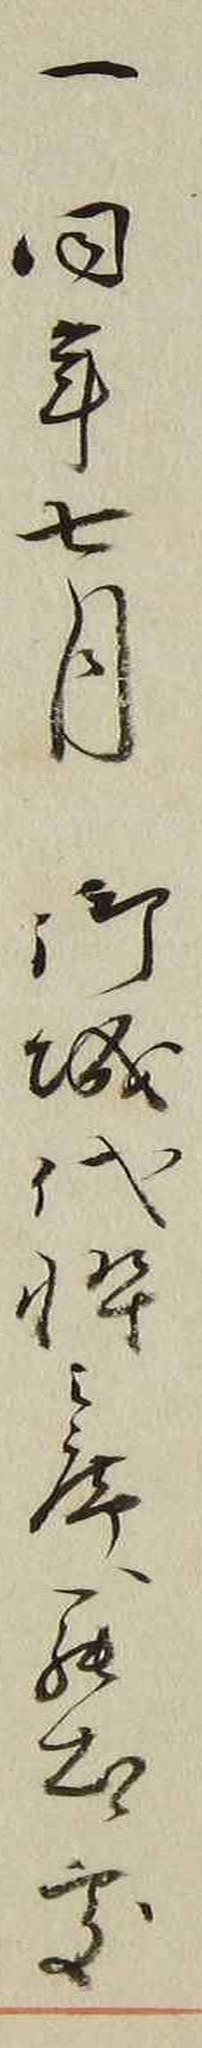一同年七月御城代忰之席へ罷出候処
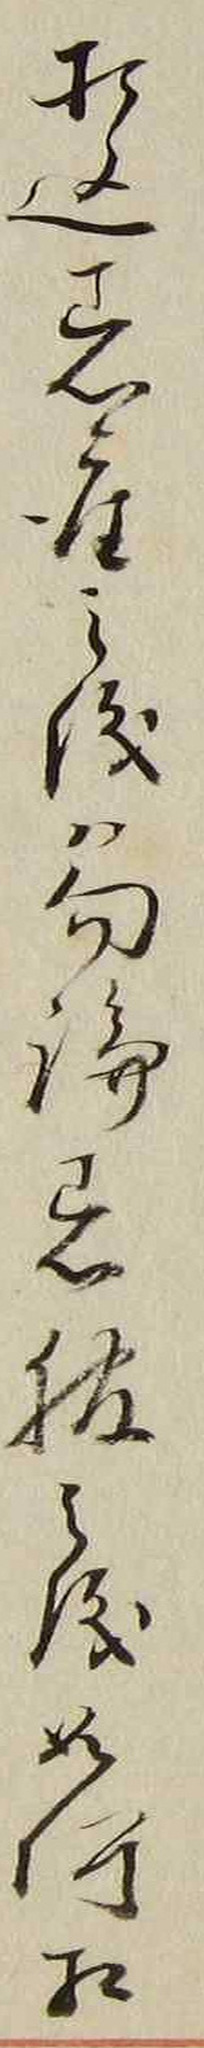打込着座之儀ハ勿論忌服之儀如何相
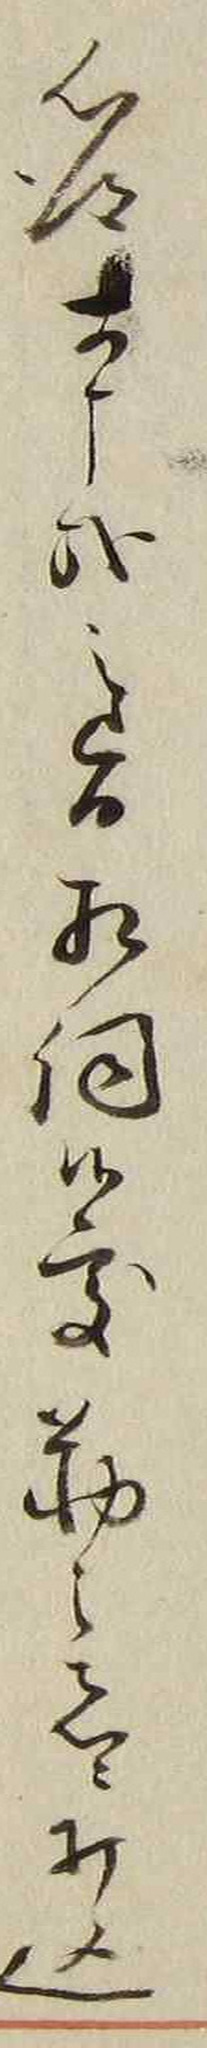心得可申哉之旨相伺候処勤之者ニ打込

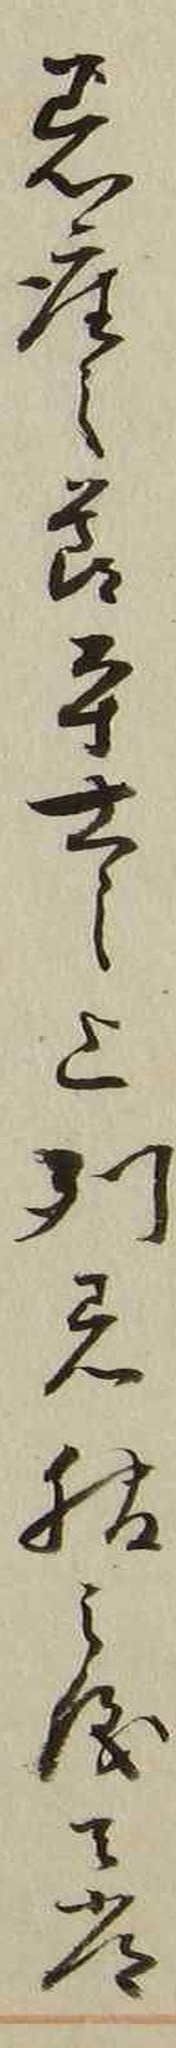着座之節平士之上列忌服之儀者常
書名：諸士系譜　巻之204　や之部1
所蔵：会津若松市立会津図書館
